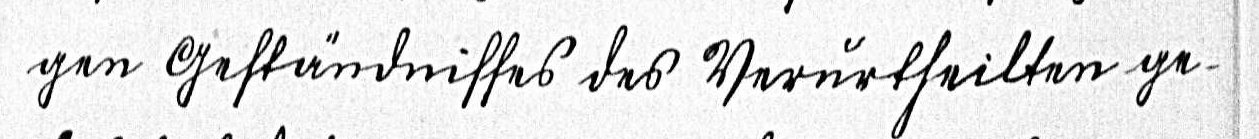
gen Geständnisses des Verurtheilten ge¬
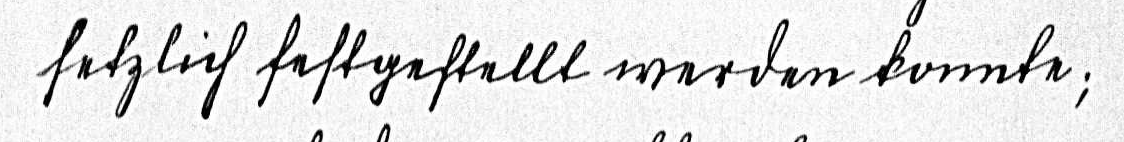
setzlich festgestellt werden konnte;
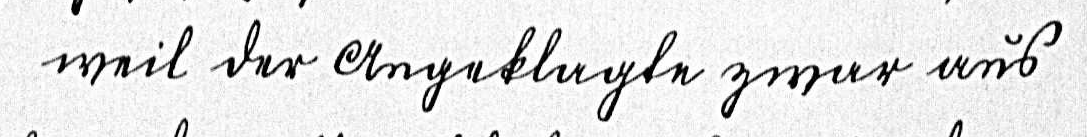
weil der Angeklagte zwar aus
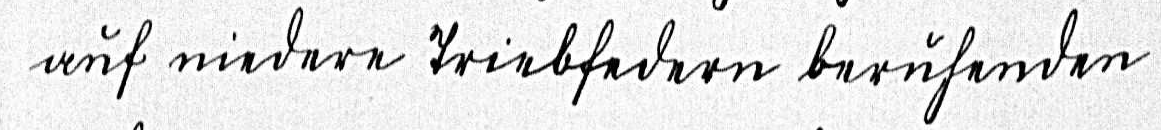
auf niedere Triebfedern beruhenden
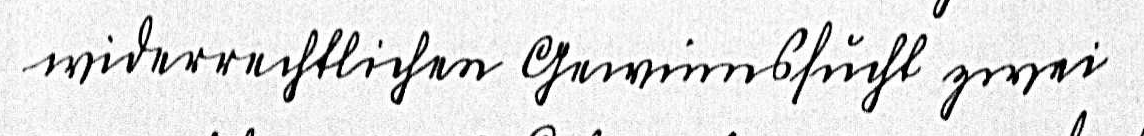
widerrechtlichen Gewinnssucht zwei
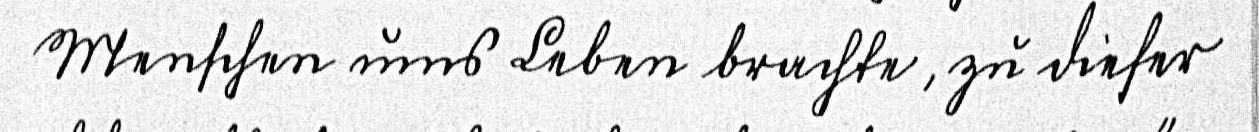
Menschen ums Leben brachte, zu dieser
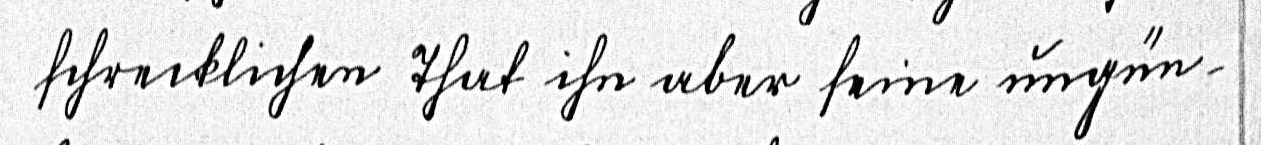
schrecklichen That ihn aber seine ungün¬
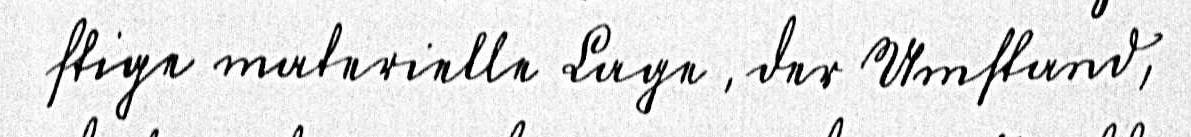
stige materielle Lage, der Umstand,
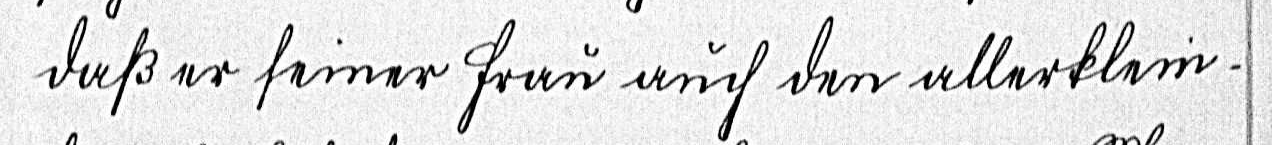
daß er seiner Frau auch den allerklein¬
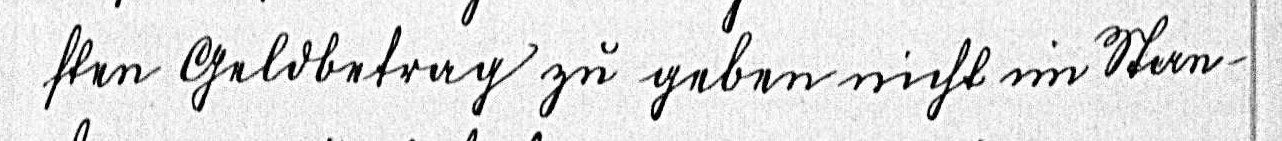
sten Geldbetrag zu geben nicht im Stan¬
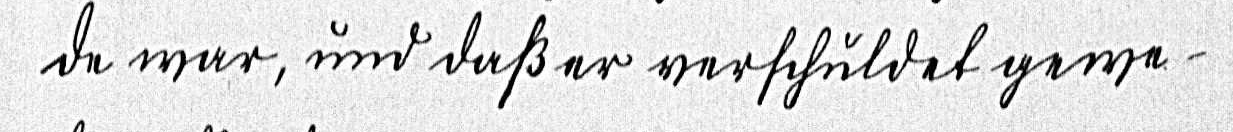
de war, und daß er verschuldet gewe¬
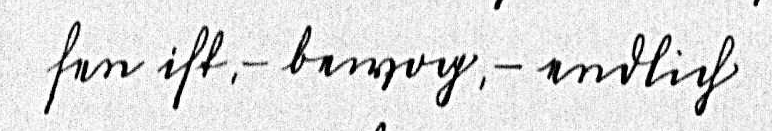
sen ist, – bewog, – endlich
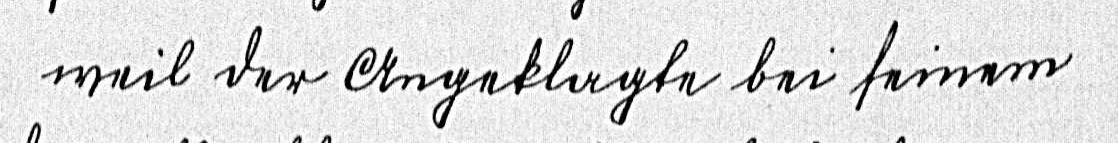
weil der Angeklagte bei seinem
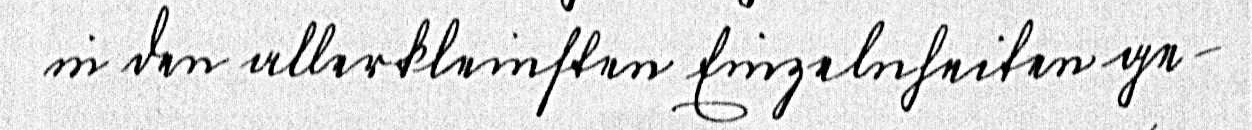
in den allerkleinsten Einzeleheiten ge¬
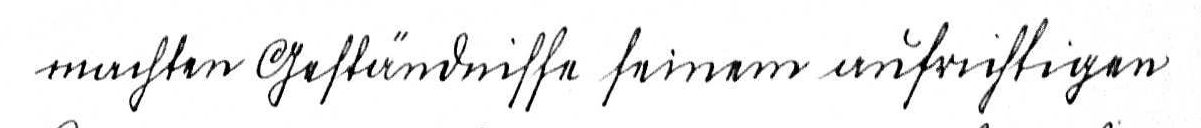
machten Geständnisse seinem aufrichtigen
